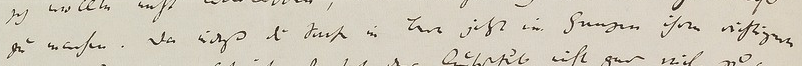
zu machen. Da indeß die Sache in Bern jetzt im Ganzen ihren richtigen
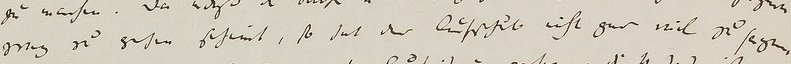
Weg zu gehen scheint, so hat der Aufschub nicht gar viel zu sagen.
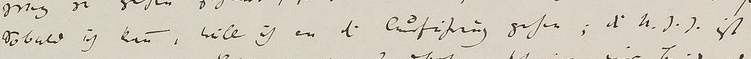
Sobald ich kann, will ich an die Ausführung gehen; die N.Z.Z. ist
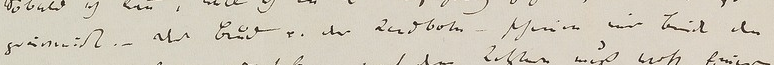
prävenirt. – Der Bund &. der Landbote scheinen mir beide den
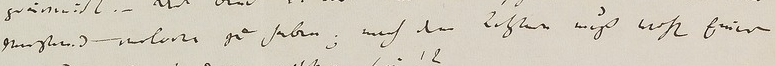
Verstand verloren zu haben; nach dem Letztern muß wohl Einer
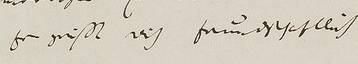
Es grüßt Dich freundschaftlich
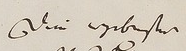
Dein ergebenster
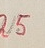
Jb.
